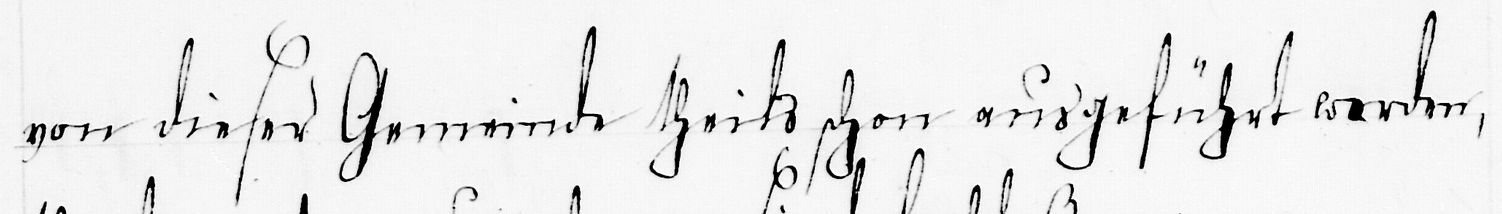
von dieser Gemeinde theils schon ausgeführt worden,
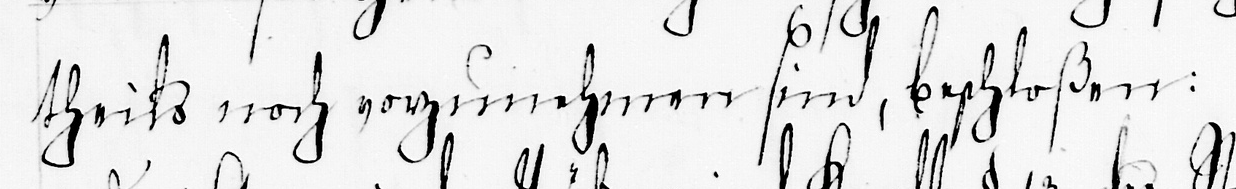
theils noch vorzunehmen sind, beschloßen:
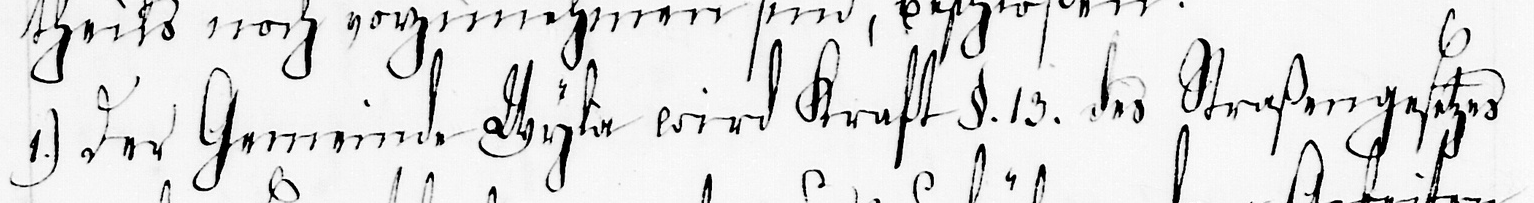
1.) Der Gemeinde Wyla wird Kraft §. 13. des Straßengesetzes
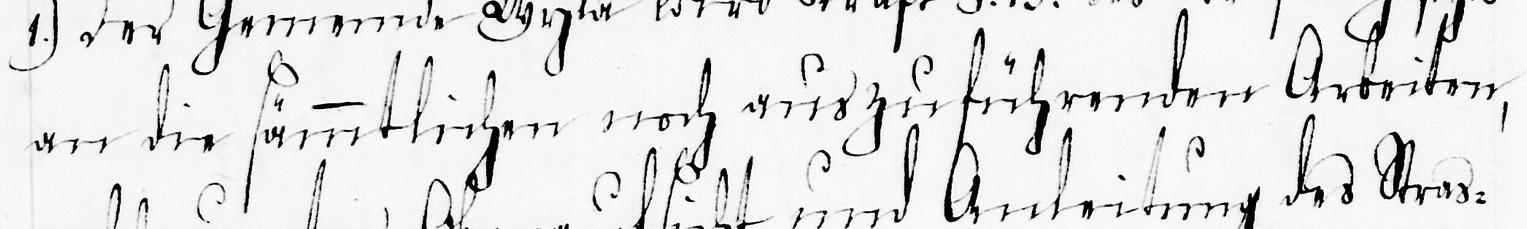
an die sämmtlichen noch auszuführenden Arbeiten,
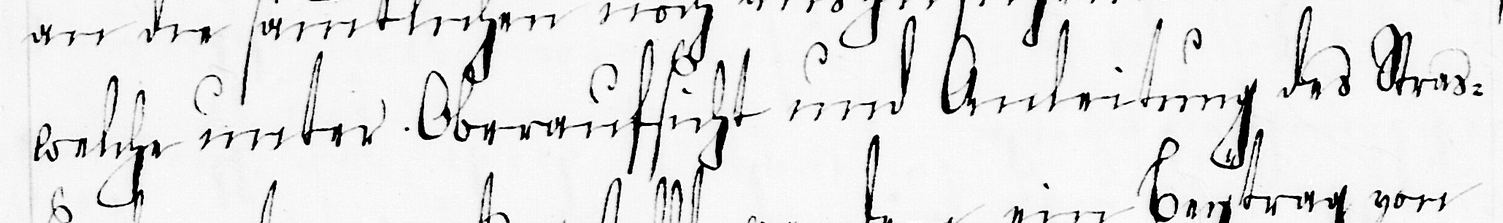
welche unter Oberaufsicht und Anleitung des Straß¬
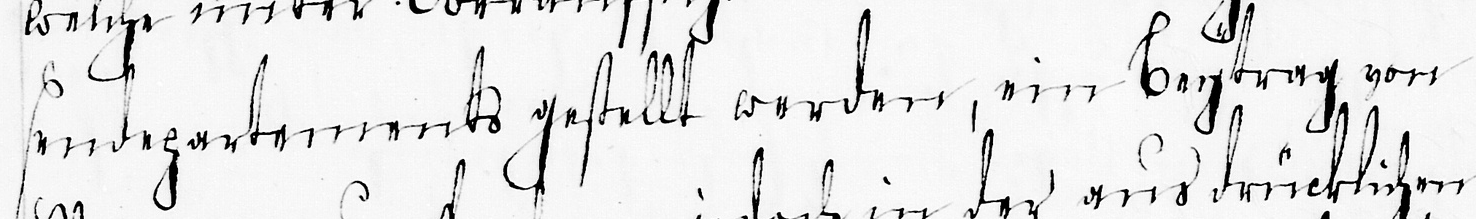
endepartements gestellt werden, ein Beytrag von
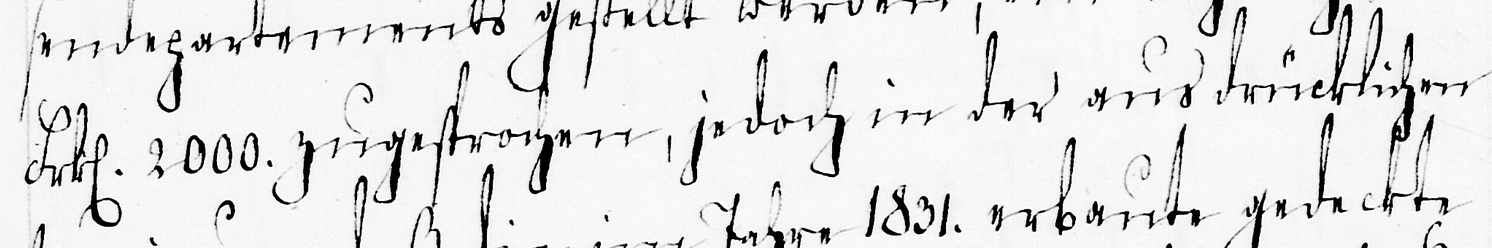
rk[en]. 2000. zugesprochen, jedoch in der ausdrücklichen
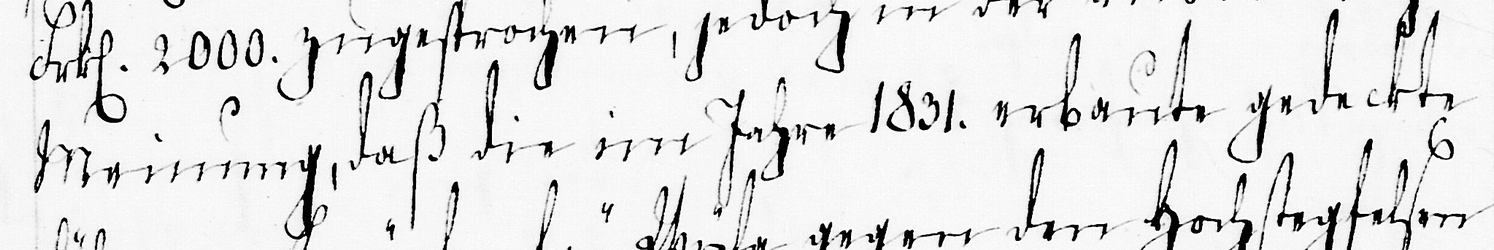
Meinung, daß die im Jahre 1831. erbaute gedeckte
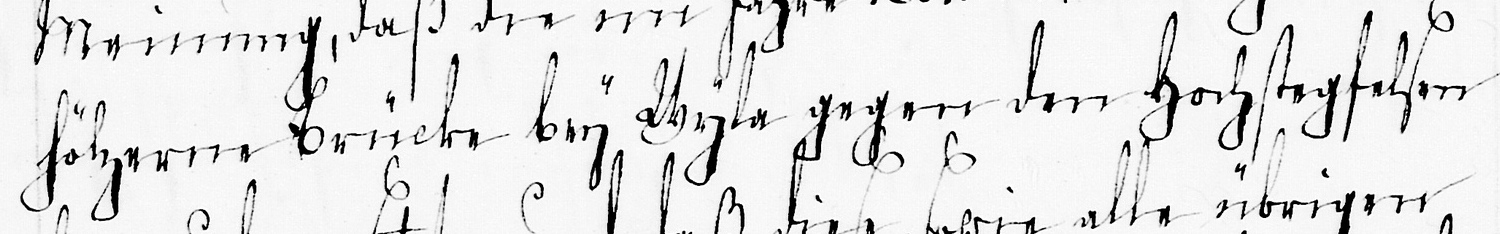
hölzerne Brücke bey Wyla gegen den Hochstegfelsen
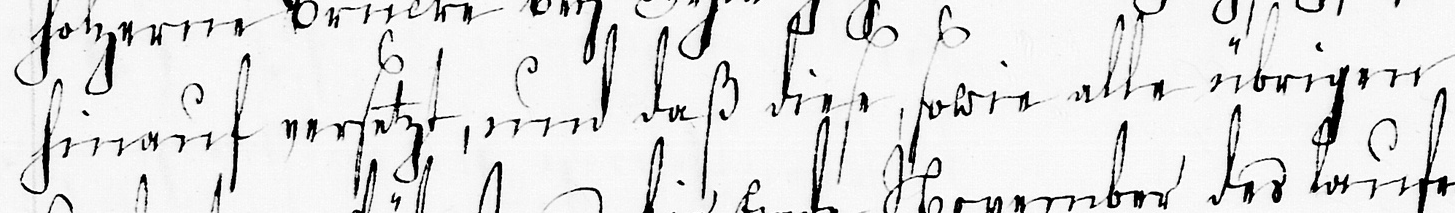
hinauf versetzt, und daß diese, sowie alle übrigen
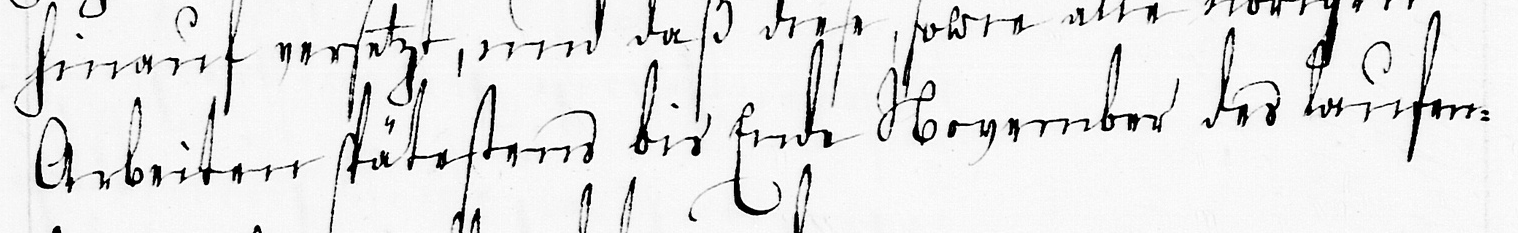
Arbeiten spätestens bis Ende November des laufen¬
